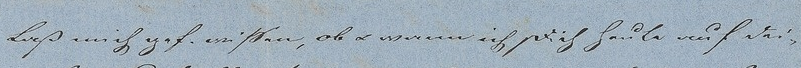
Laß mich gef. wissen, ob & wann ich Dich heute auf dei-
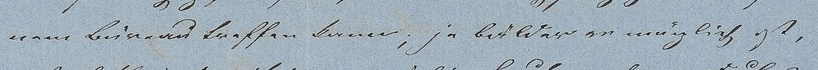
nem Büreau treffen kann; je bälder es möglich ist,
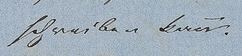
schreiben kann.
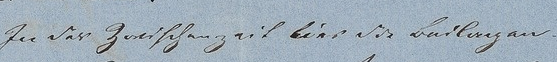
In der Zwischenzeit lies die Beilagen.
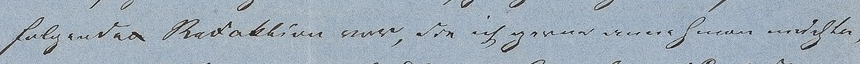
folgendes Redaktion vor, die ich gerne annehmen möchte,
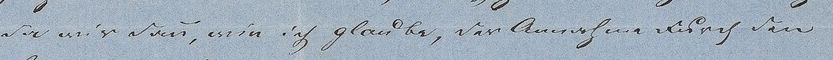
da wir dann, wie ich glaube, der Annahme durch den
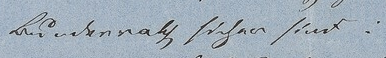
Bundesrath sicher sind:
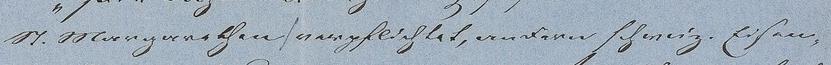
St. Margarethen verpflichtet, andern schweiz. Eisen-
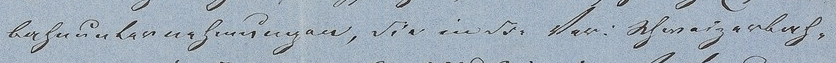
bahnunternehmungen, die in die Ver: Schweizerbah-
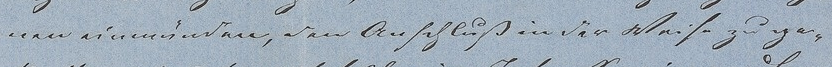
nen einmünden, den Anschluß in der Weise zu ge-
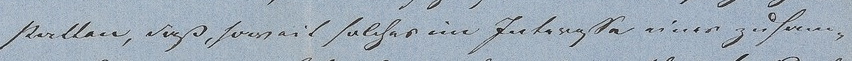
statten, daß, soweit solches im Interesse eines zusam-
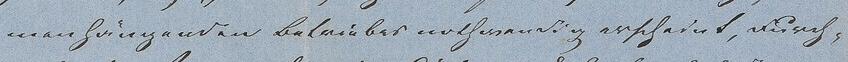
menhängenden Betriebes nothwendig erscheint, durch-
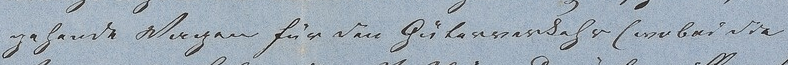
gehende Wagen für den Güterverkehr (wobei die
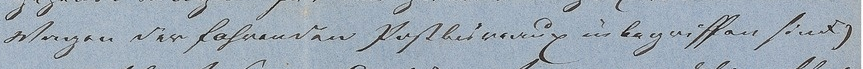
Wagen der fahrenden Postbüreaux inbegriffen sind)
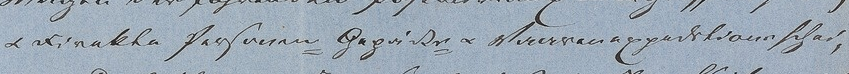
& direkte Personen-Gepäcks- & Waarenexpeditionsschei-
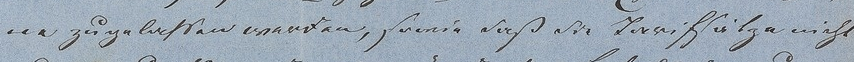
ne zugelassen werden, sowie daß die Tarifsätze nicht
